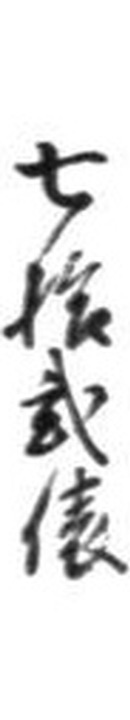七拾弐俵
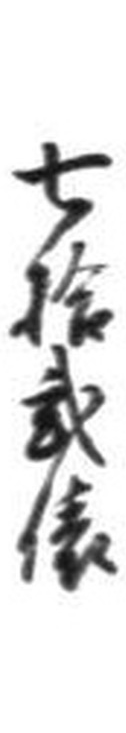七拾弐俵
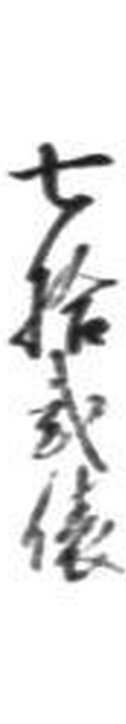七拾弐俵
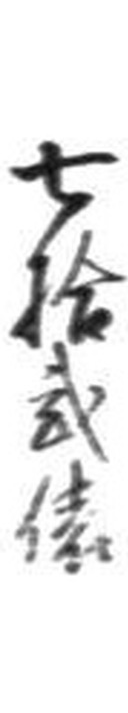七拾弐俵
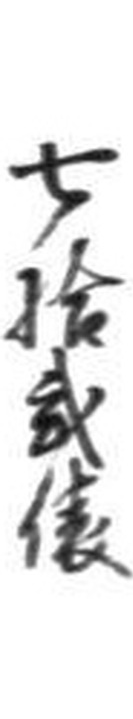七拾弐俵
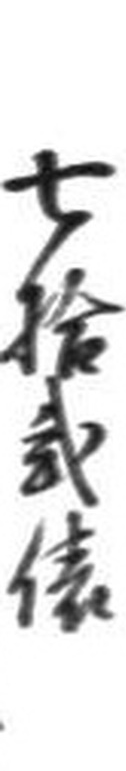七拾弐俵
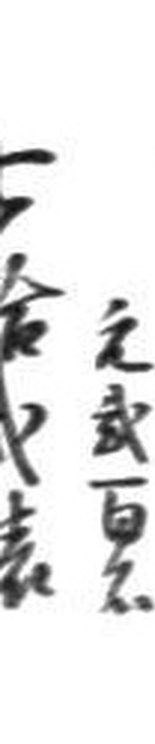七拾弐俵
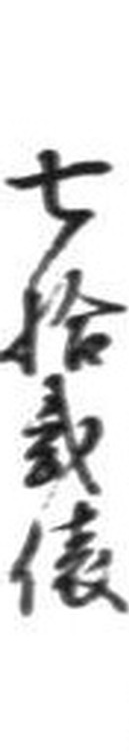七拾弐俵

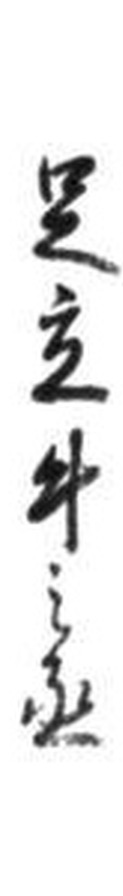足立牛之丞
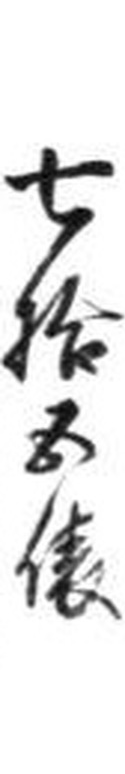七拾五俵
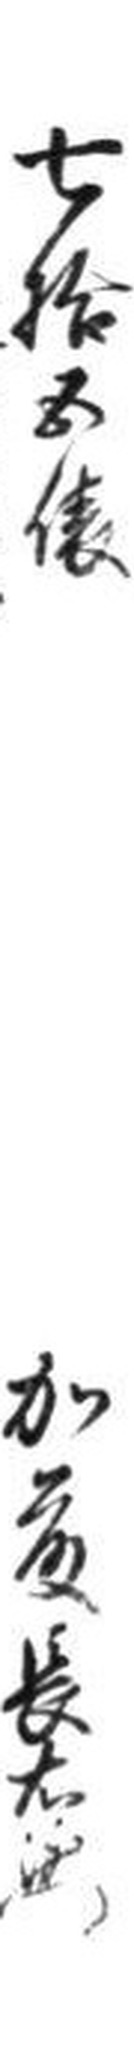元百五拾石加藤長右衛門
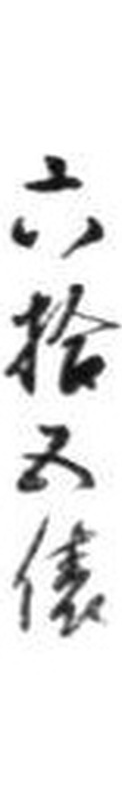六拾五俵
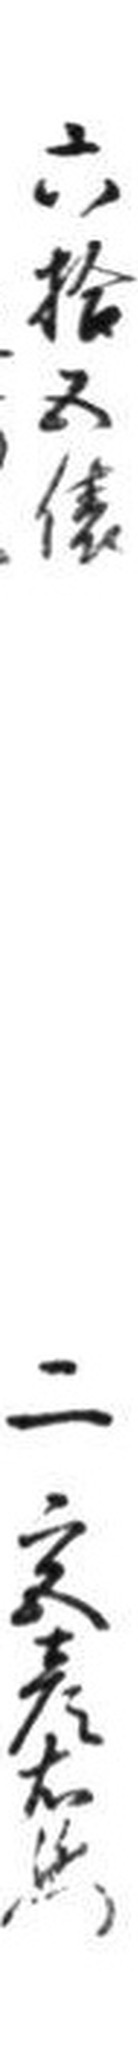元百石二宮彦右衛門
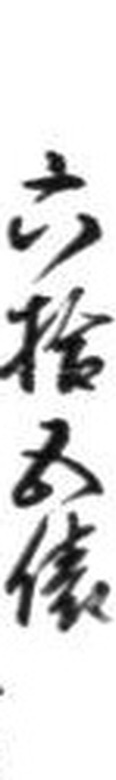六拾五俵
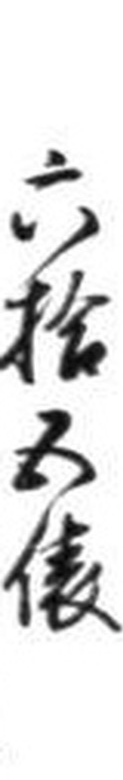六拾五俵
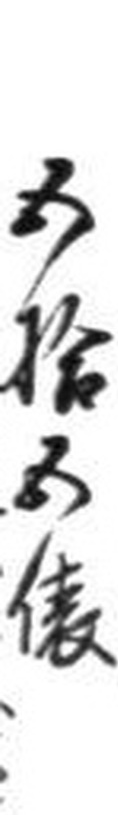五拾五俵
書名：家譜 十五 綱昌公 従天和元年到元禄十二年
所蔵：福井県文書館 Fukui Prefectural Archives
